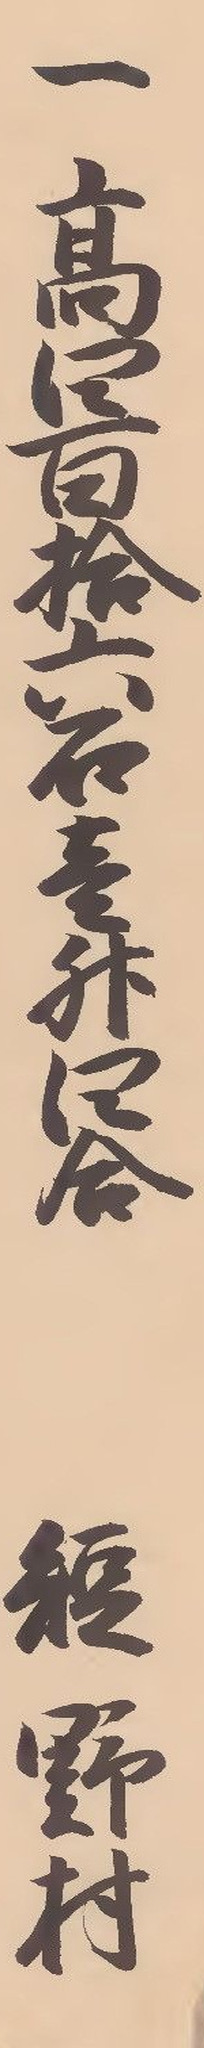一高四百拾六石壱升四合短野村
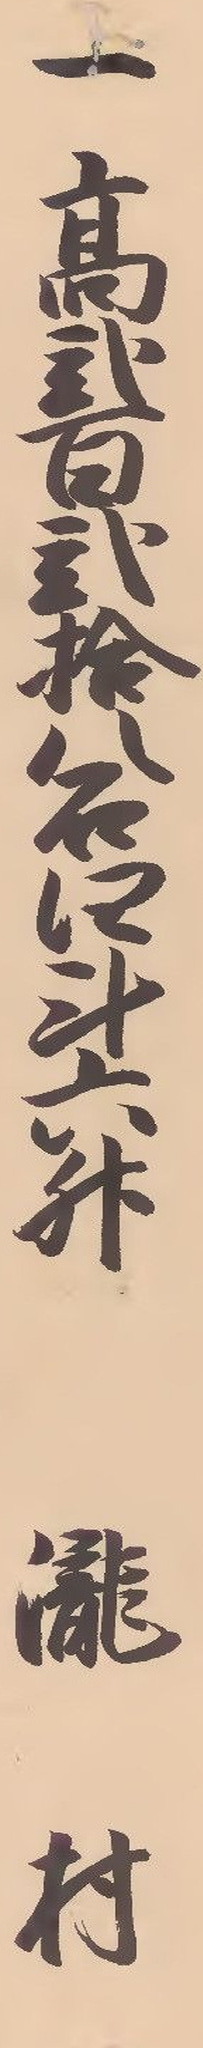一高弐百弐拾八石四斗六升滝村
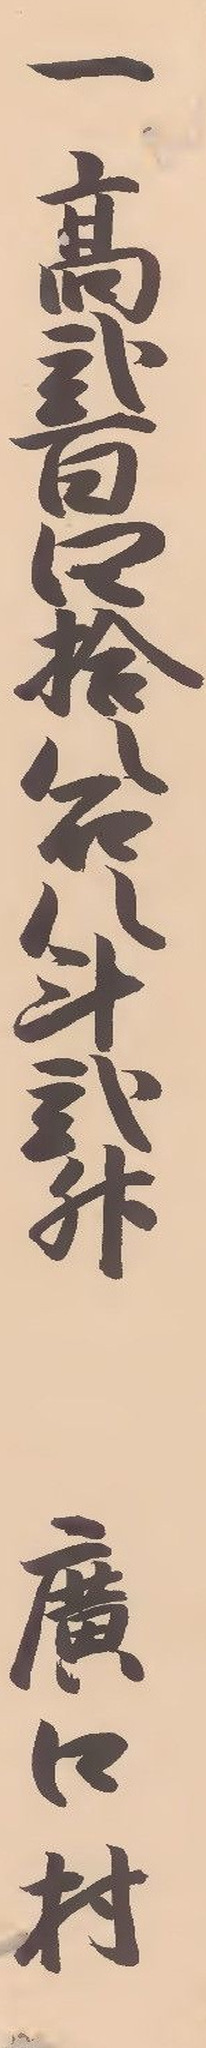一高弐百四拾八石八斗弐升広口村
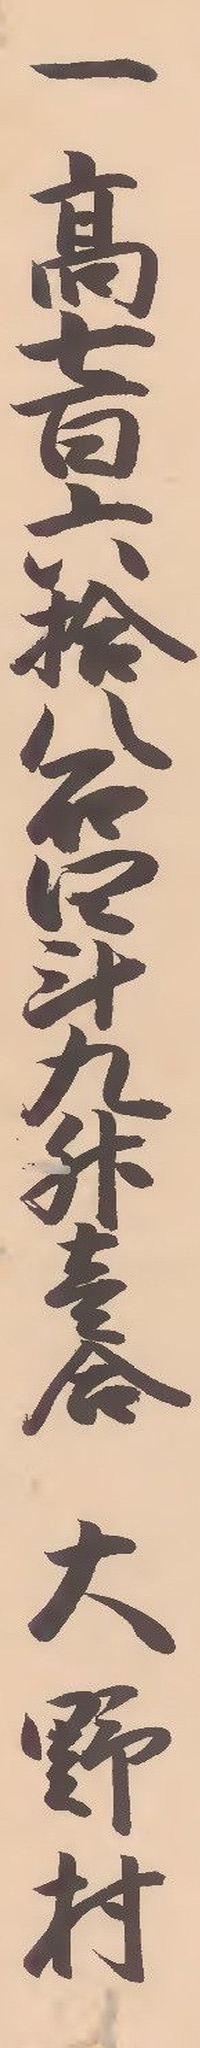一高七百六拾八石四斗九升壱合大野村

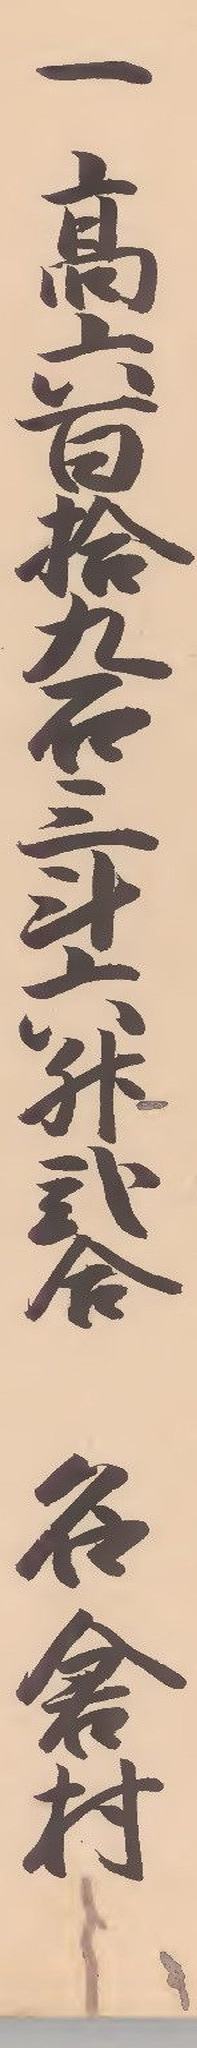一高六百拾九石三斗六升弐合名倉村
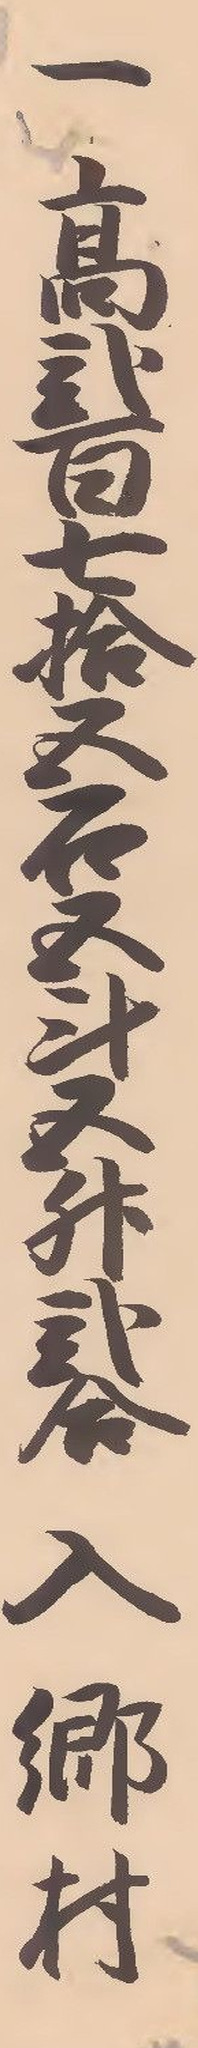一高弐百七拾五石五斗五升弐合入郷村
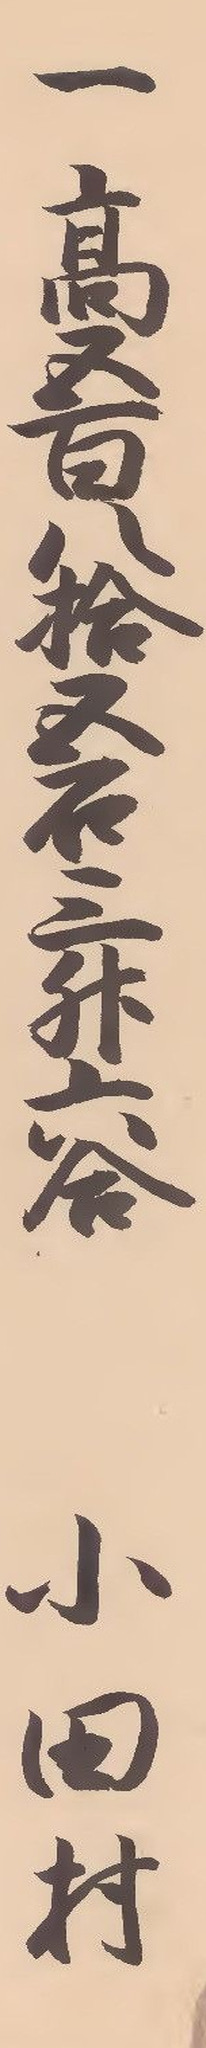一高五百八拾五石三升六合小田村
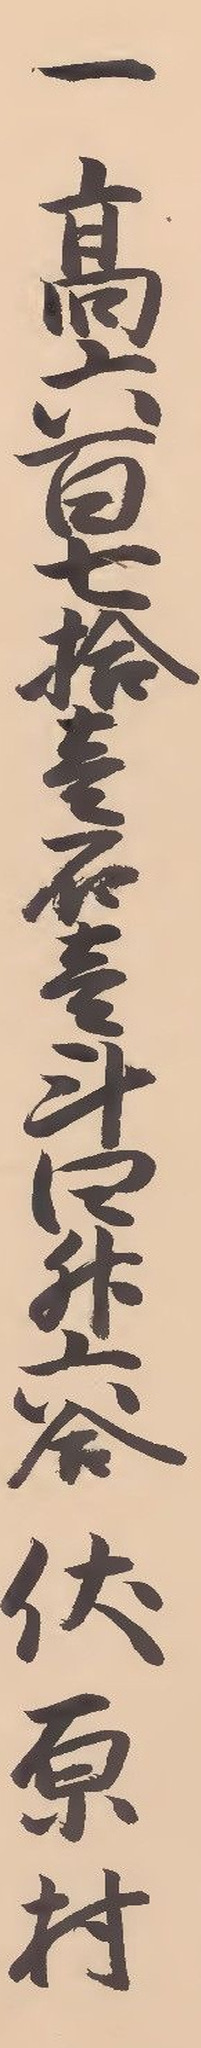一高六百七拾壱石壱斗四升六合伏原村
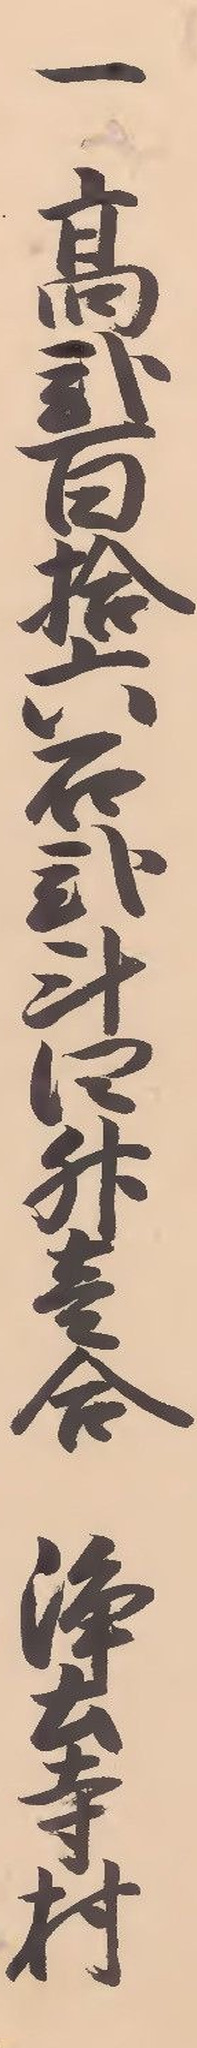一高弐百拾六石弐斗四升壱合浄土寺村
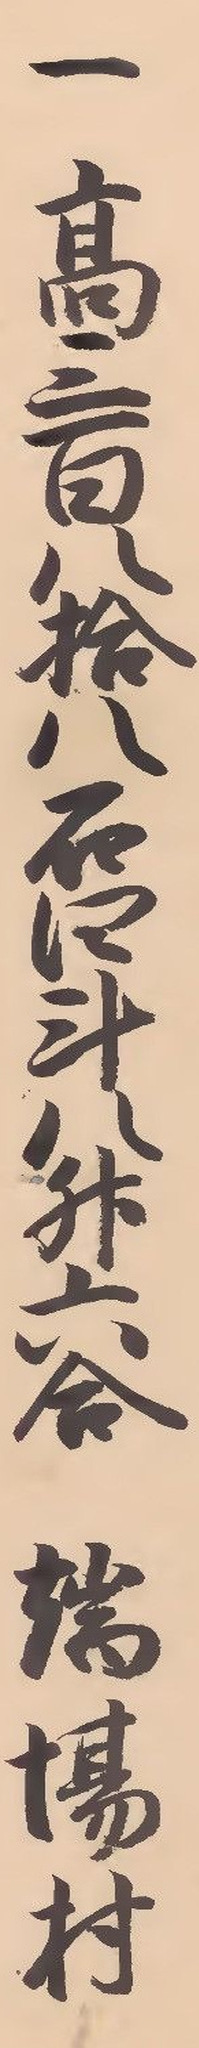一高三百八拾八石四斗八升六合端場村

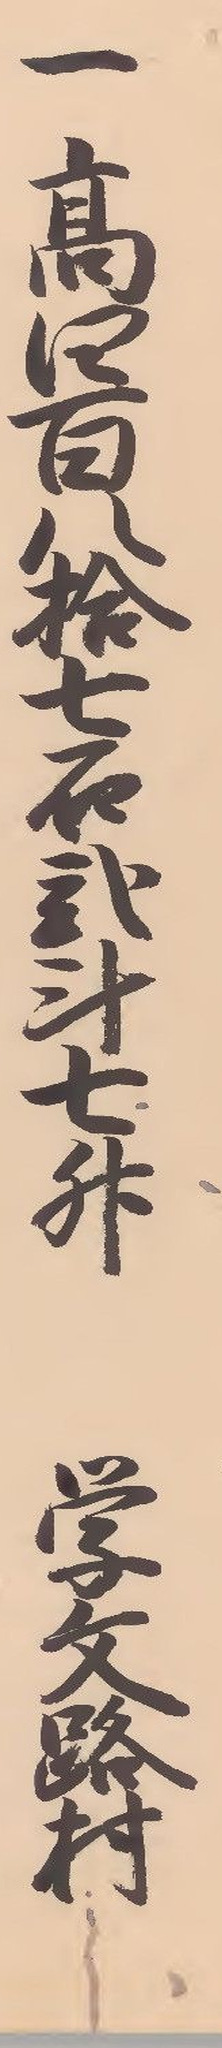一高四百八拾七石弐斗七升学文路村
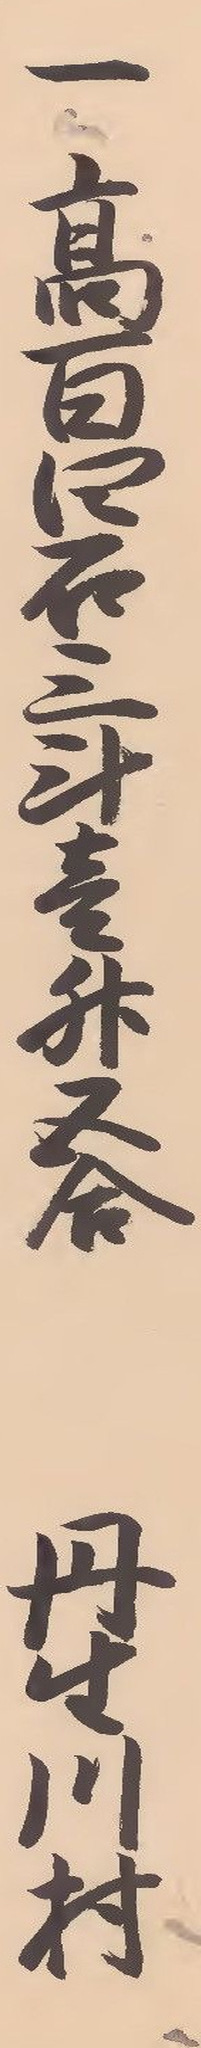一高百四石三斗壱升五合丹生川村
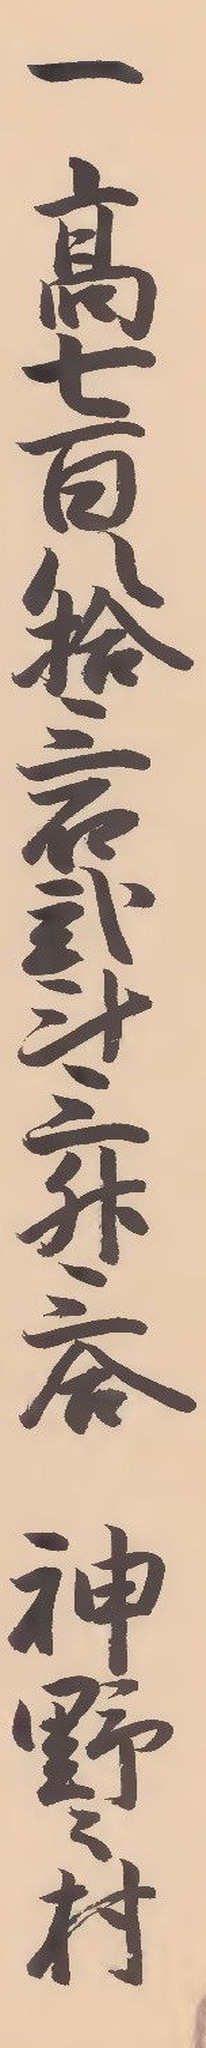一高七百八拾三石弐斗三升三合神野々村
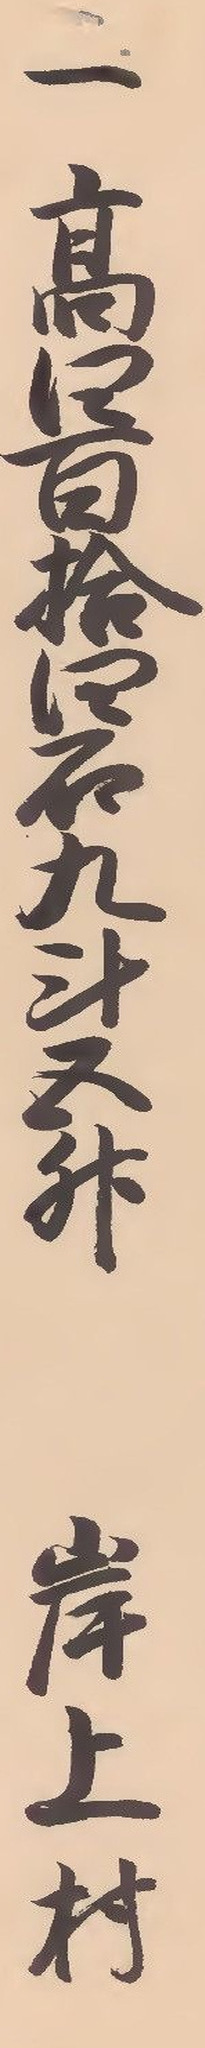一高四百拾四石九斗五升岸上村
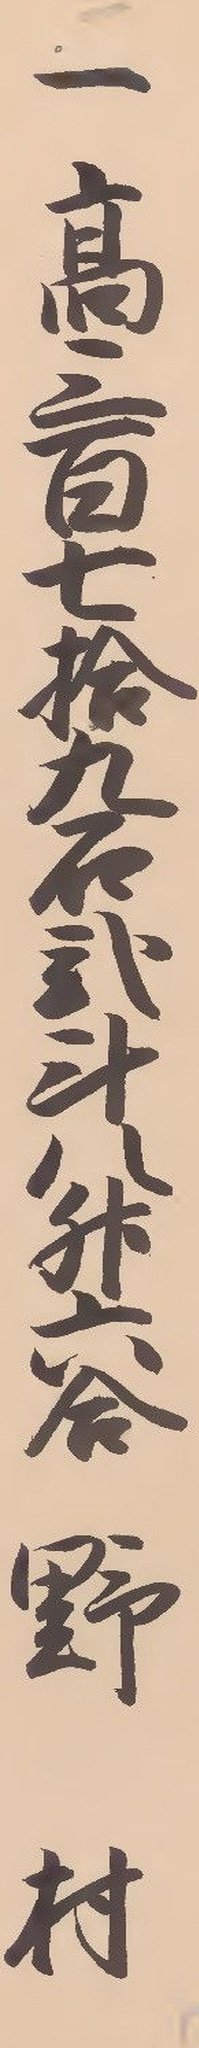一高三百七拾九石弐斗八升六合野村
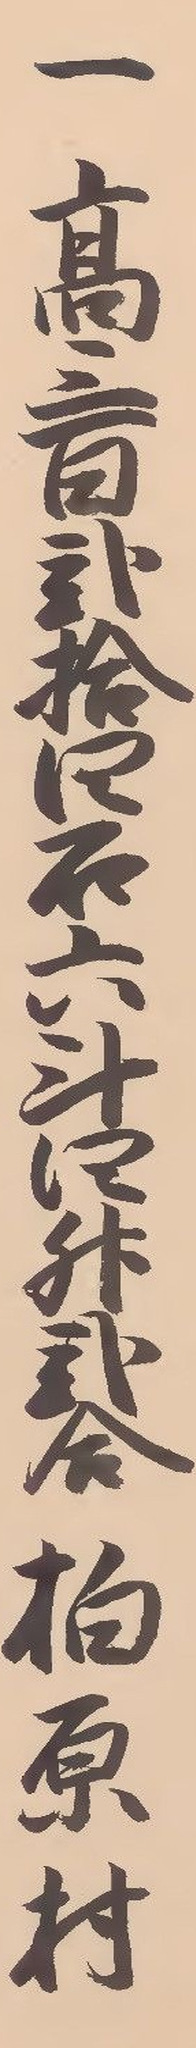一高三百弐拾四石六斗四升弐合柏原村
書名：紀伊国郷帳
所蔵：国立公文書館 National Archives of Japan
